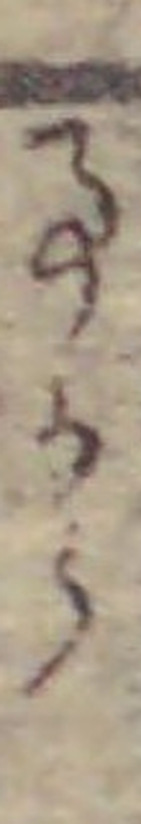事から
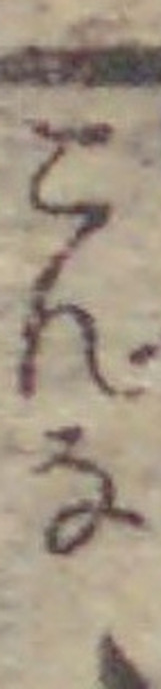こんな

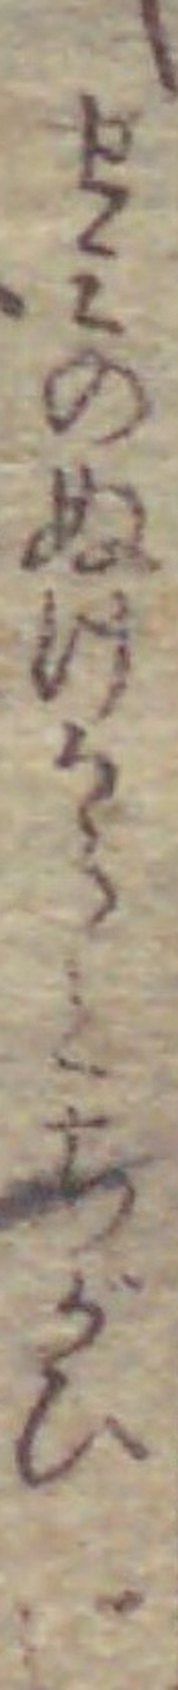〽せみのぬけからとちがひ
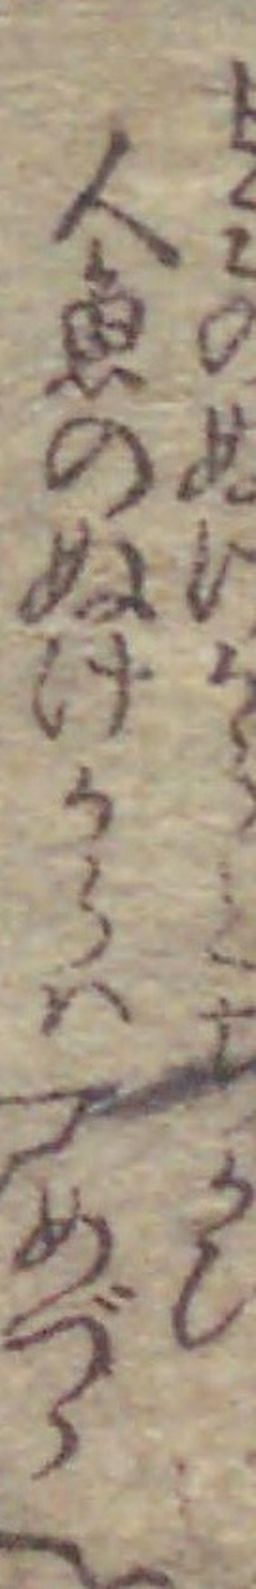人魚のぬけからはめづら
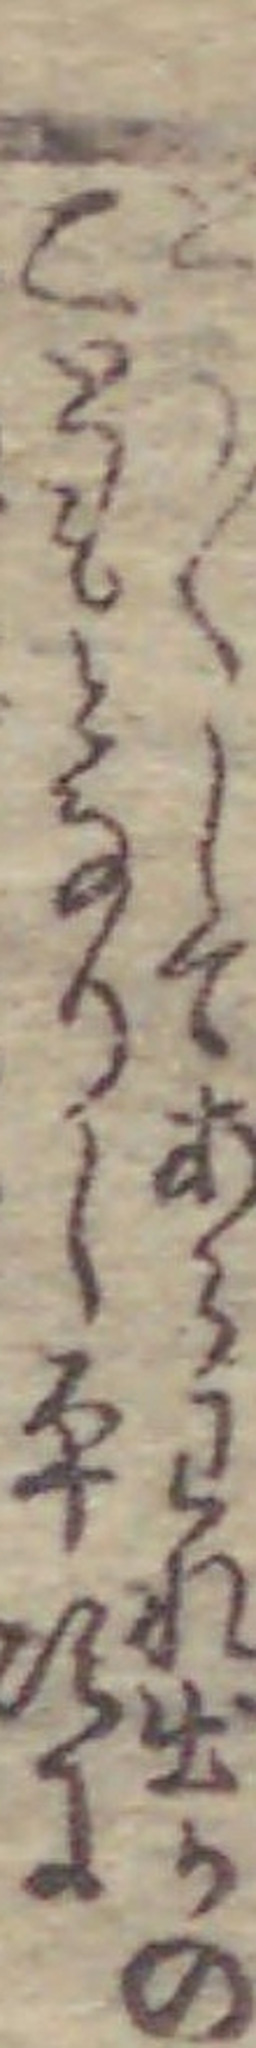こともとなりし平次に
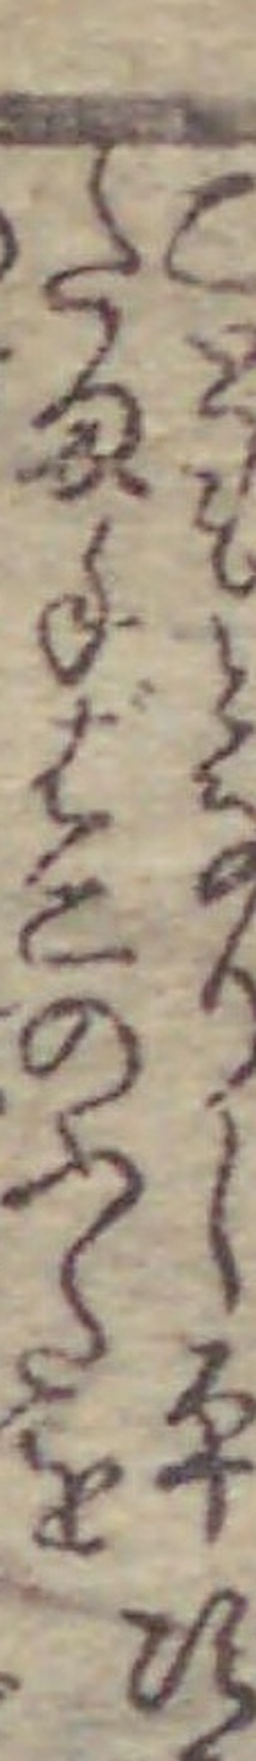たま手ばこのふたを
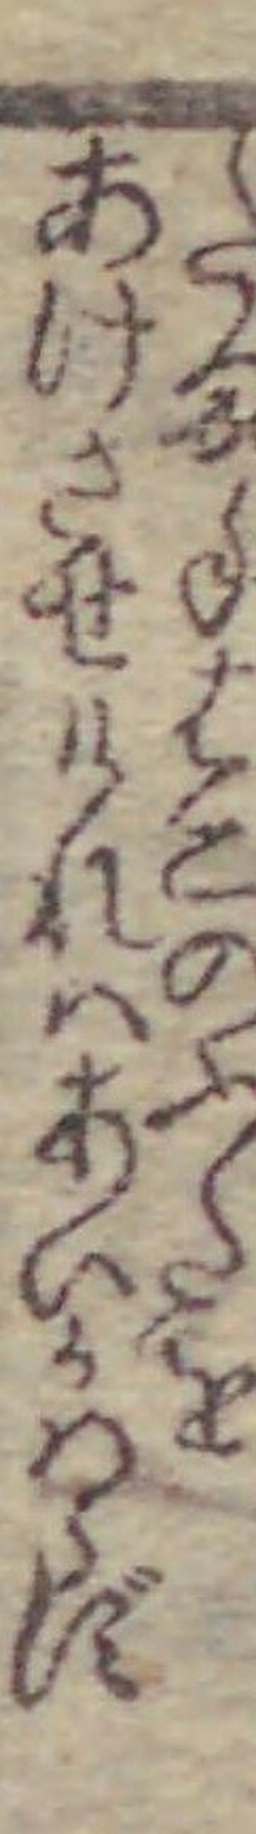あけさせけれはあいかわらず
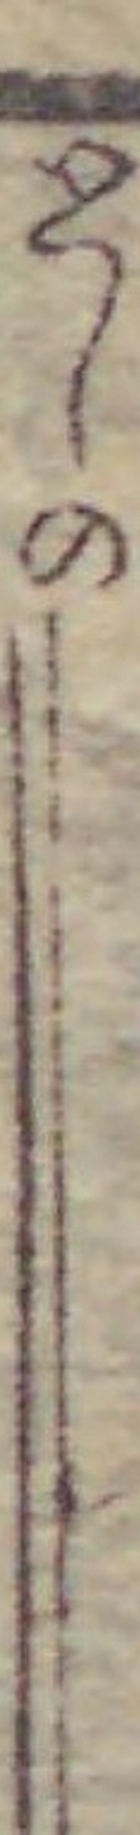としの
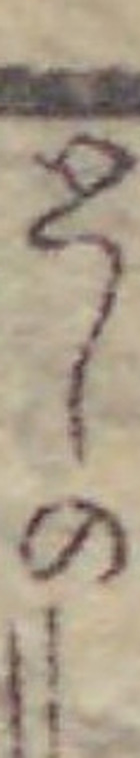としの
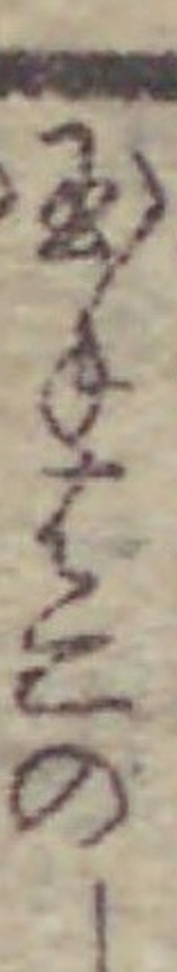玉手はこの
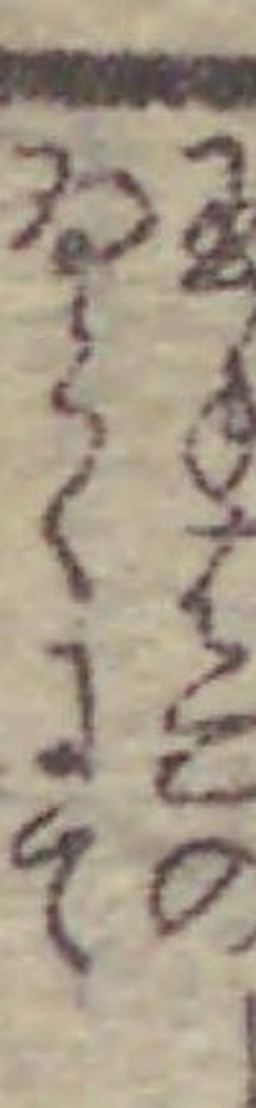ゐとくにて
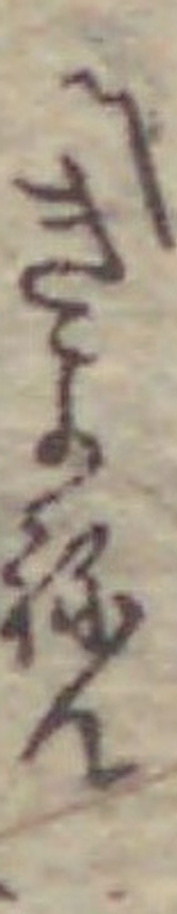〽きよねん
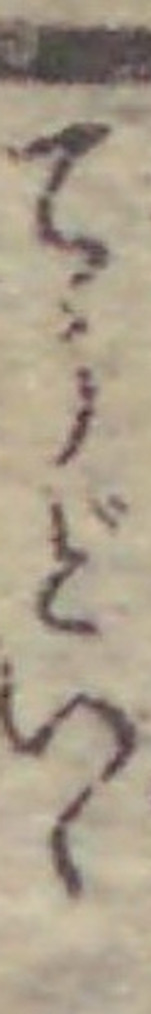てうどいゝ
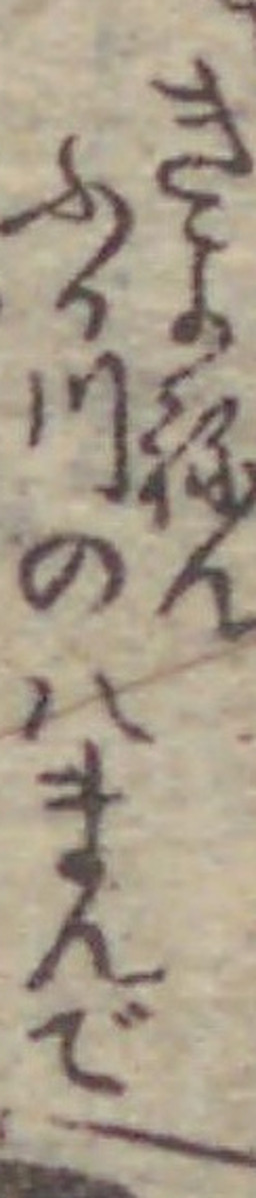ふか川の八まんで
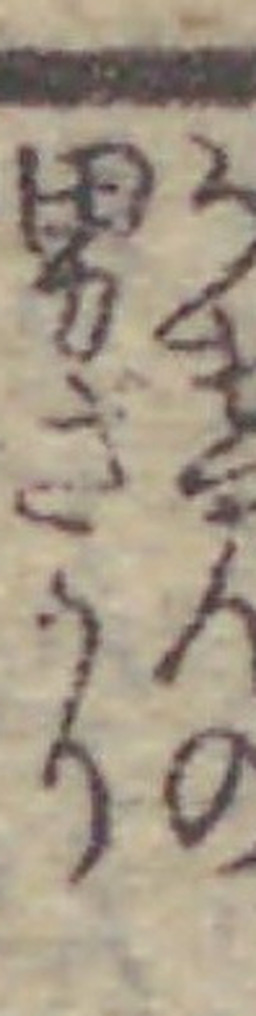男ざかり
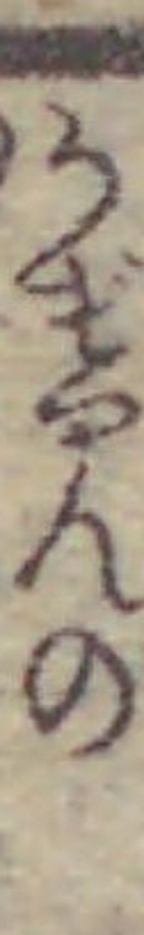けげんの
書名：箱入娘面屋人魚 3巻
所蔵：国立国会図書館 National Diet Library, JAPAN
